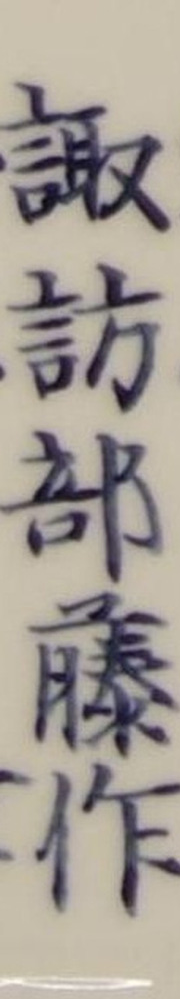諏訪部藤作

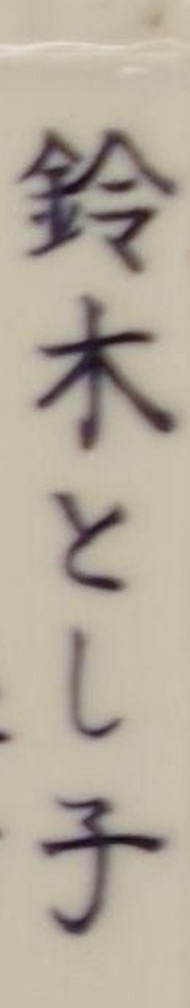鈴木とし子
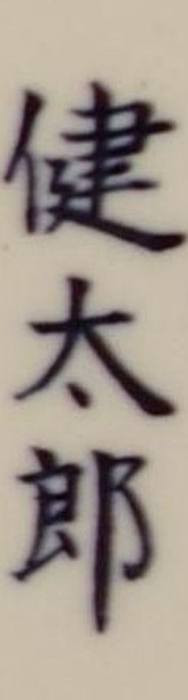健太郎
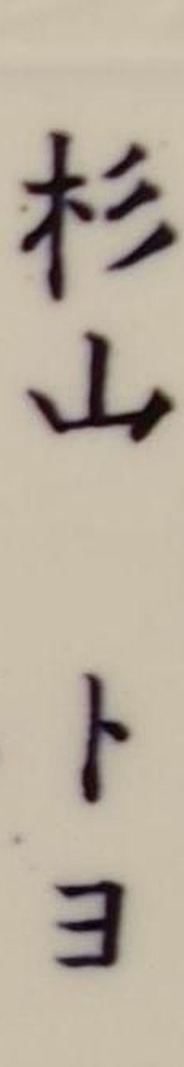杉山トヨ
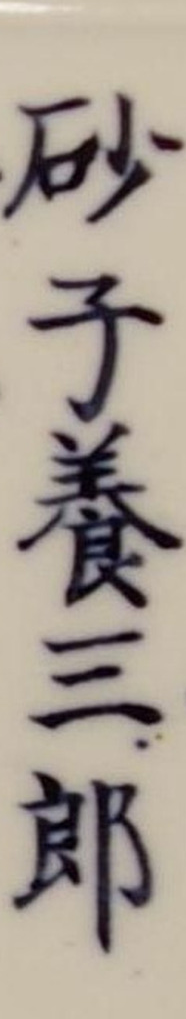砂子養三郎
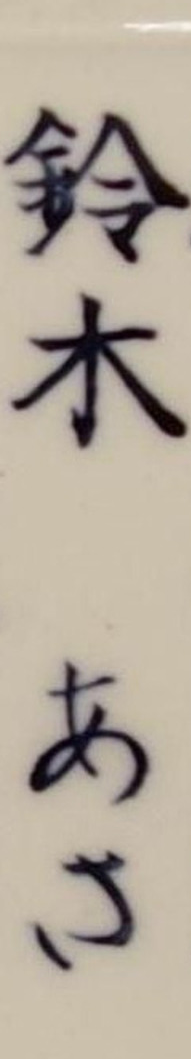鈴木あさ
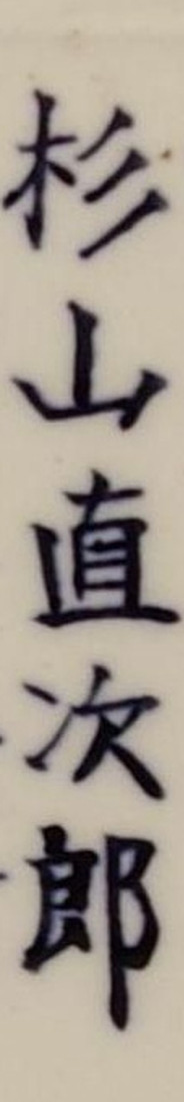杉山直次郎
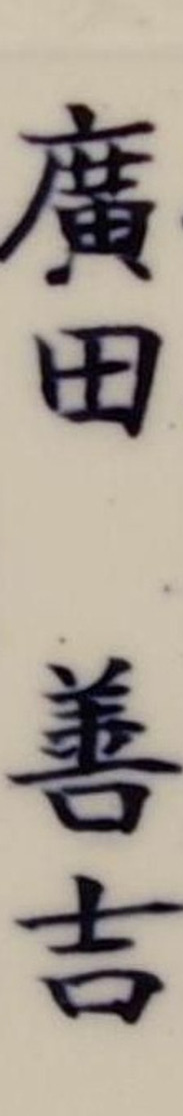廣田善吉
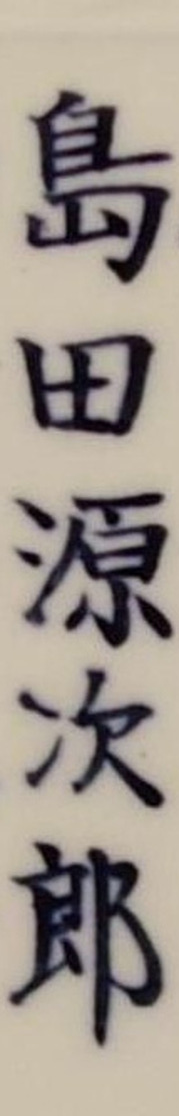島田源次郎
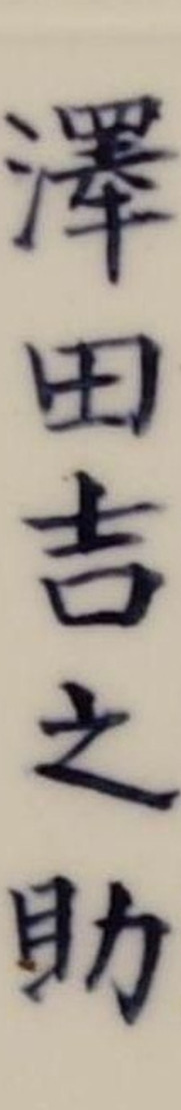澤田吉之助
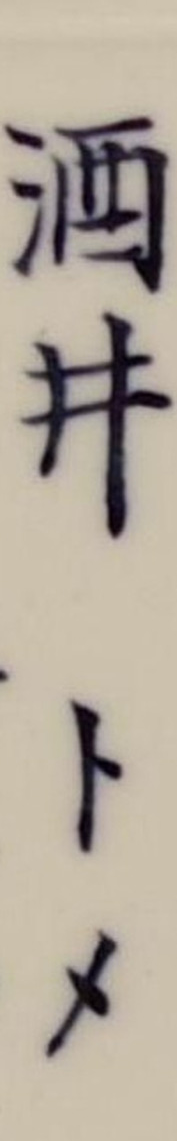酒井トメ
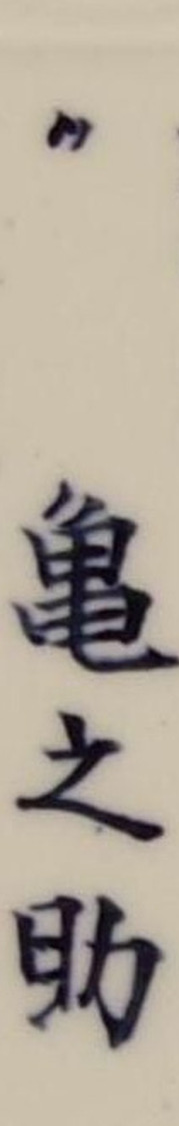亀之助
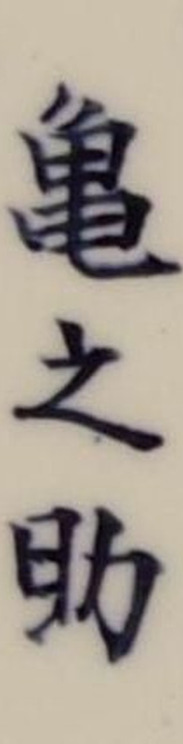亀之助
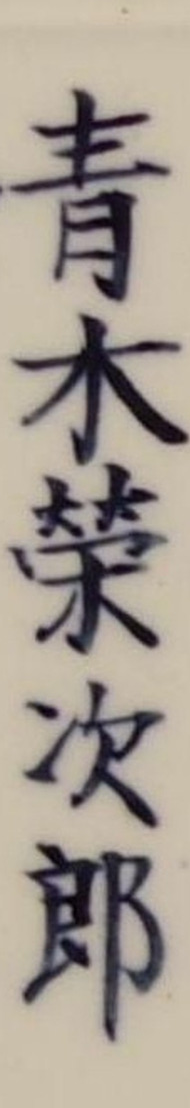青木榮次郎
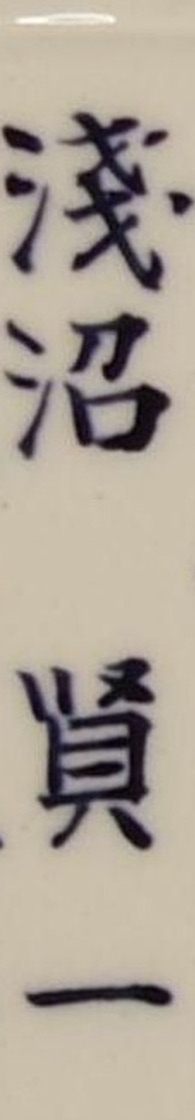浅沼賢一
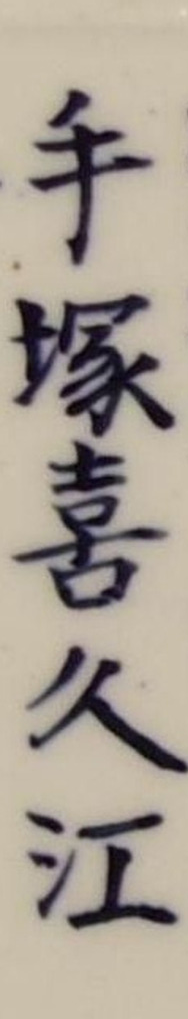手塚喜久江
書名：E~L
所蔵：高野山金剛峯寺
